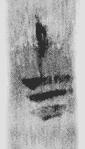十三
